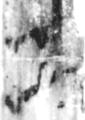壬
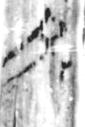丑
